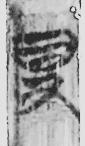𠭁（得）
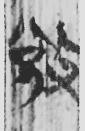敓（說）
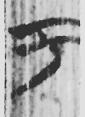于
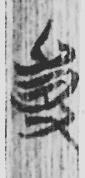尃
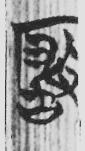{厂敢}
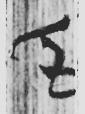氒
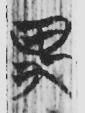卑
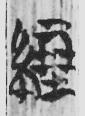{糸朋土}
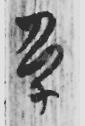弓
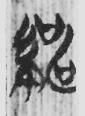紳
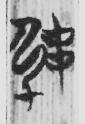{弓串}
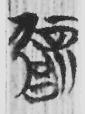辟
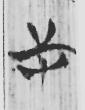矢
